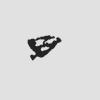則
